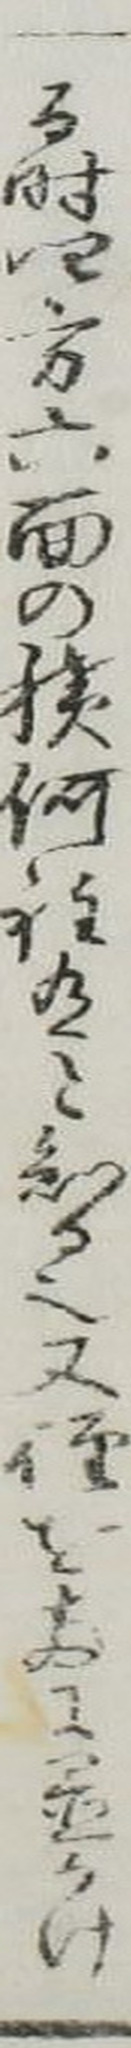る時四方六面の積何程有と知る也又径を両に置かけ
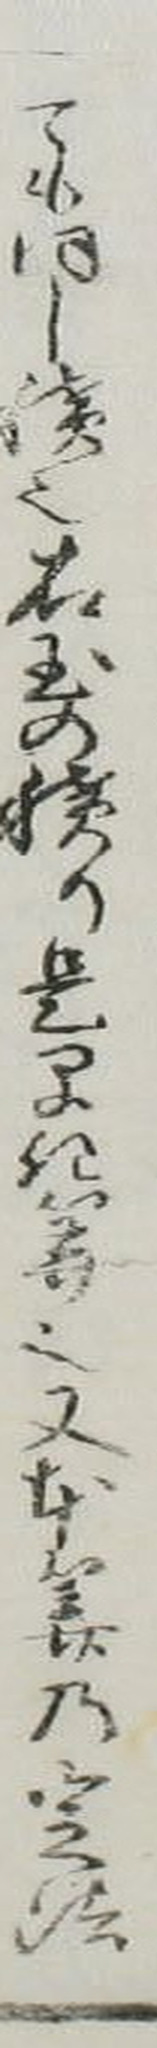ても同し積也右玉の積り是早き算也又本算の定法
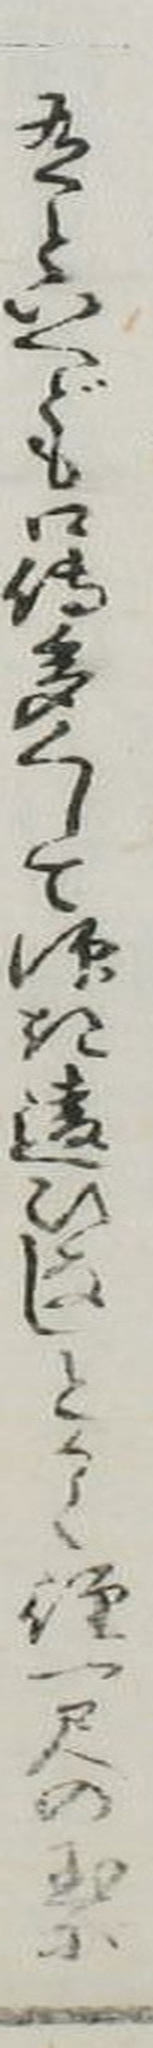有といへども口伝多くして深き違ひなしとかく径一尺の玉に
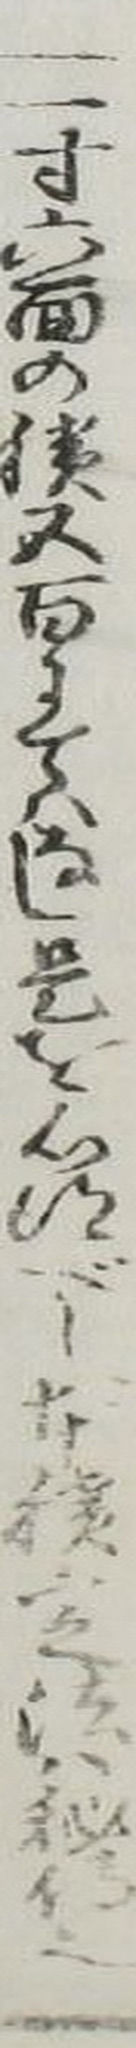一寸六面の積五百にてはなし是を以心得べし本積定法は秘伝也
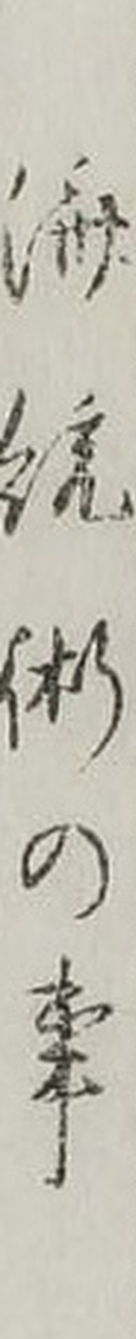○済統術の事
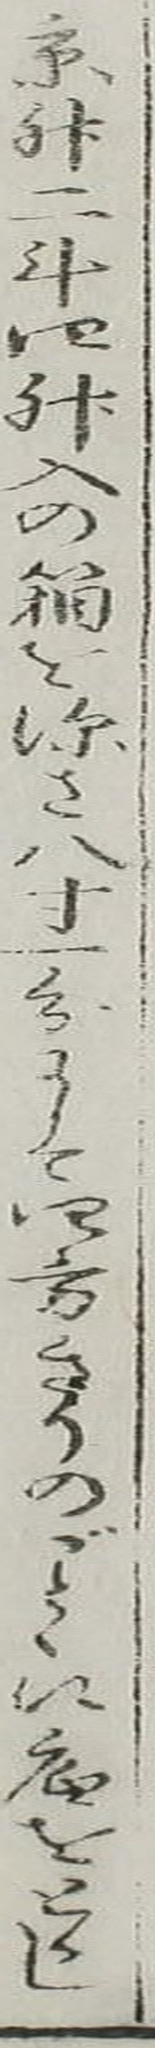○京升二斗四升入の箱を深さ八寸一分にして四方きりのごとくに底をとかし
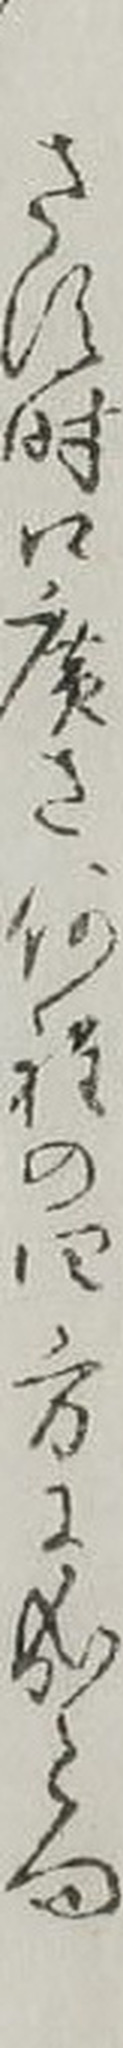さす時口広さ何程の四方に成と問
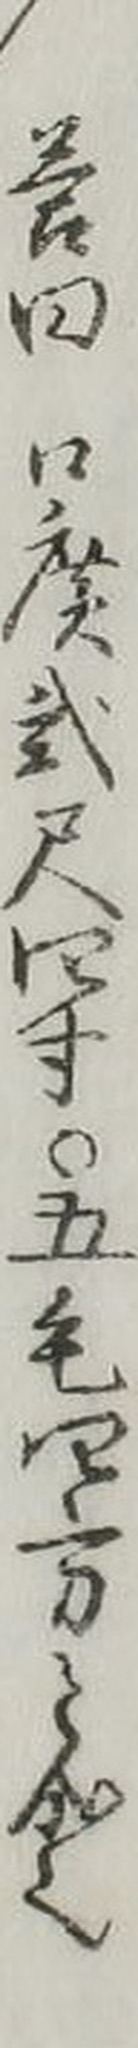同同答曰口広弐尺四寸〇五毛四方と成也
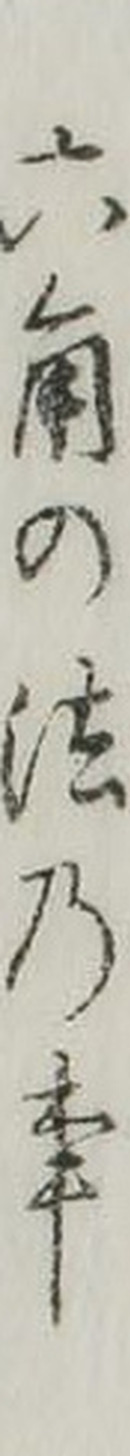○六角の法の事
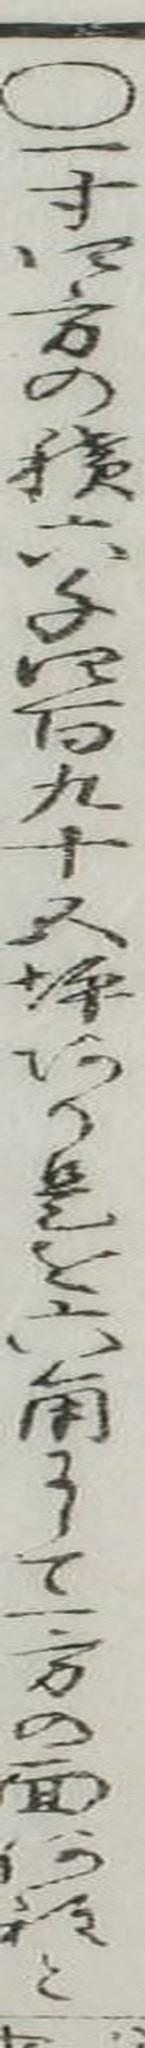○一寸四方の積六千四百九十五坪あり是を六角にして一方の面何程と
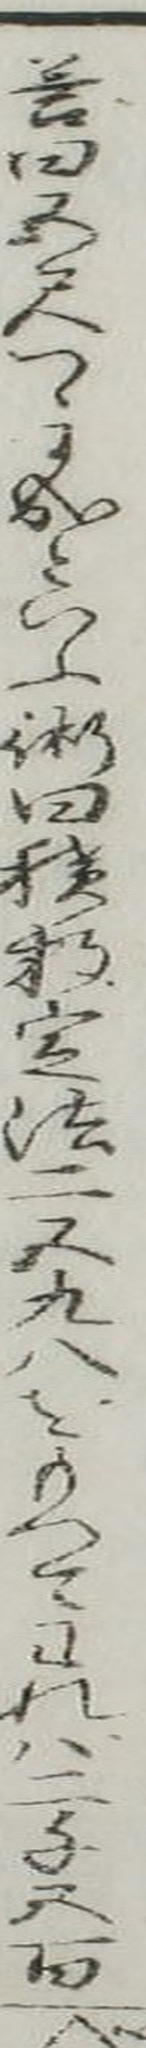答曰五尺つゝに成といふ術曰積数定法二五九八をもつてわれば二千五百
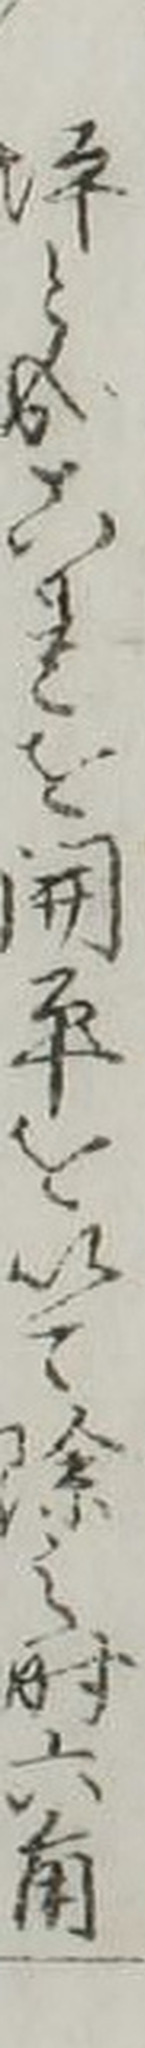坪と成これを開平を以て徐之時六角
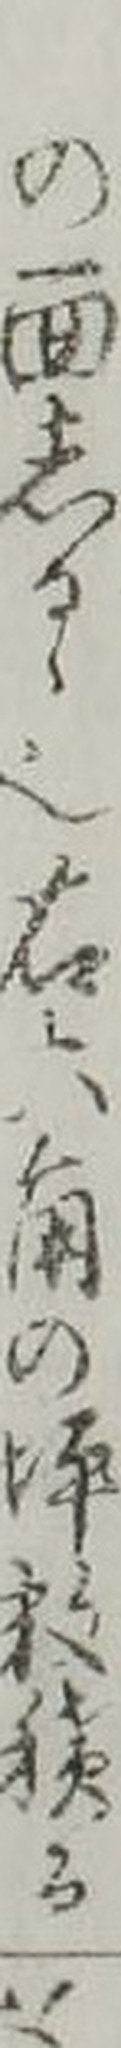五尺の面しるゝ也右六角の坪数積る
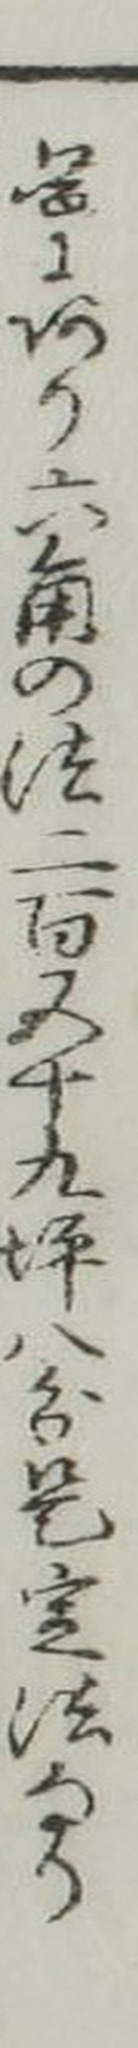図にあり六角の法二百五十九坪八分是定法なり

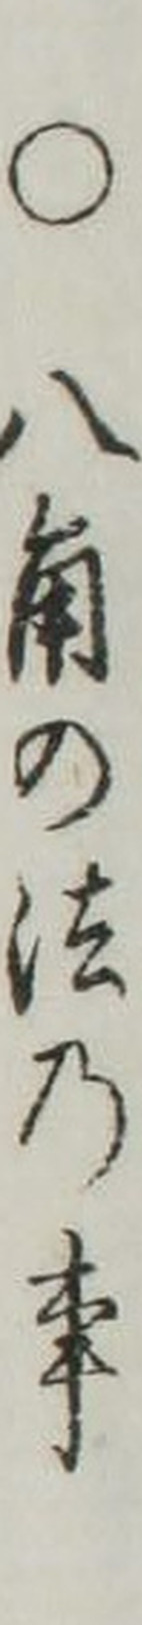○八角の法の事
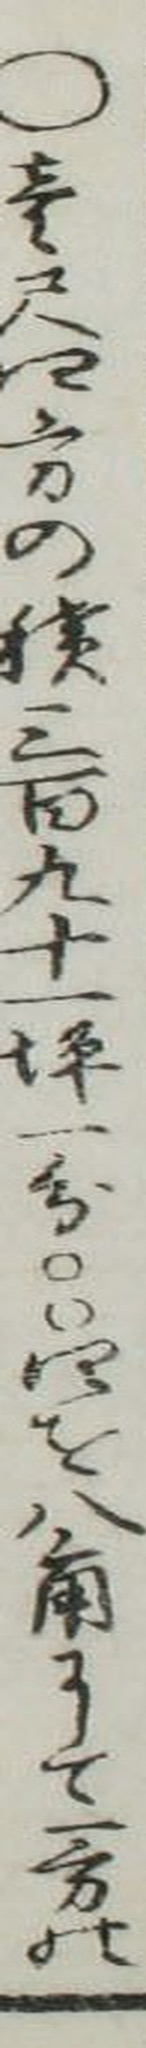九尺○壱尺四方の積三百九十一坪一分〇〇四を八角にて一方の
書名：宝玉塵劫記
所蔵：東京学芸大学教育コンテンツアーカイブ
